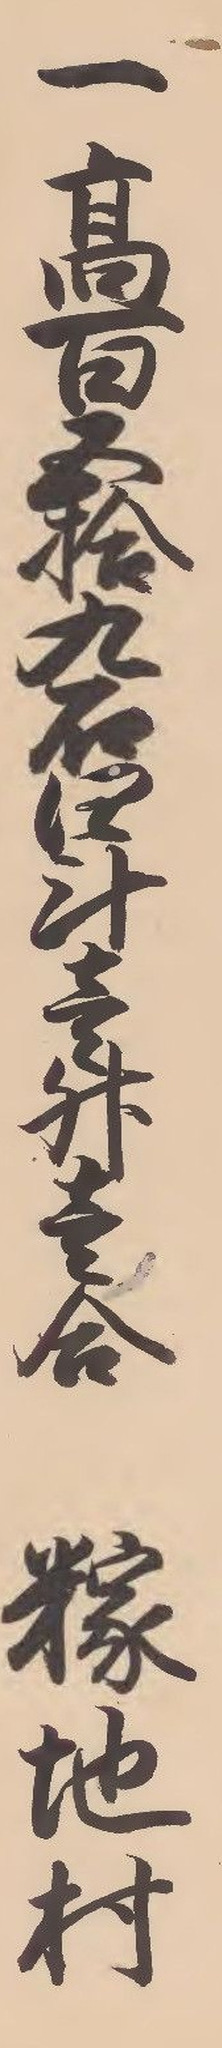一高百五拾九石四斗壱升壱合糘地村

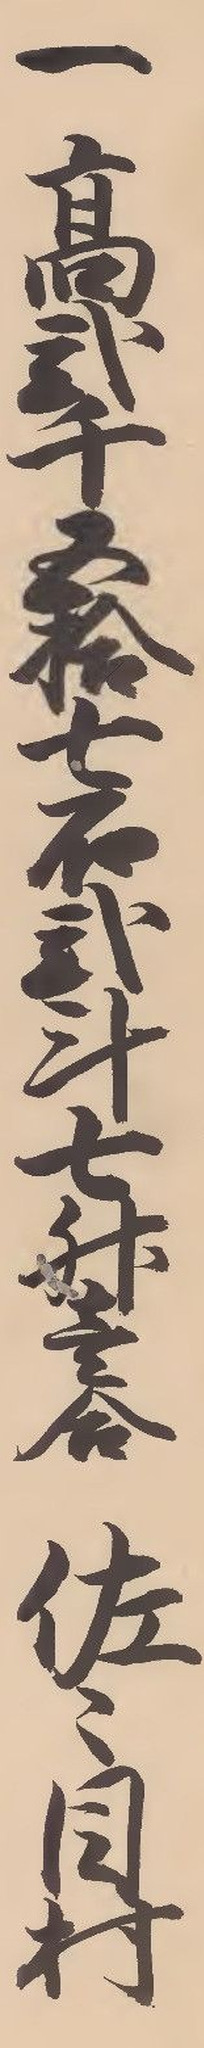一高弐千五拾七石弐斗七升壱合佐々目村
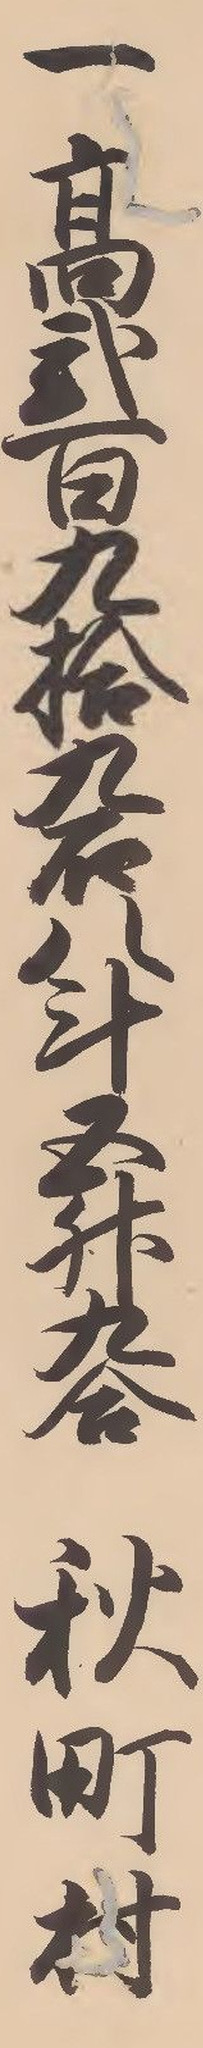一高弐百九拾九石八斗五升九合秋町村
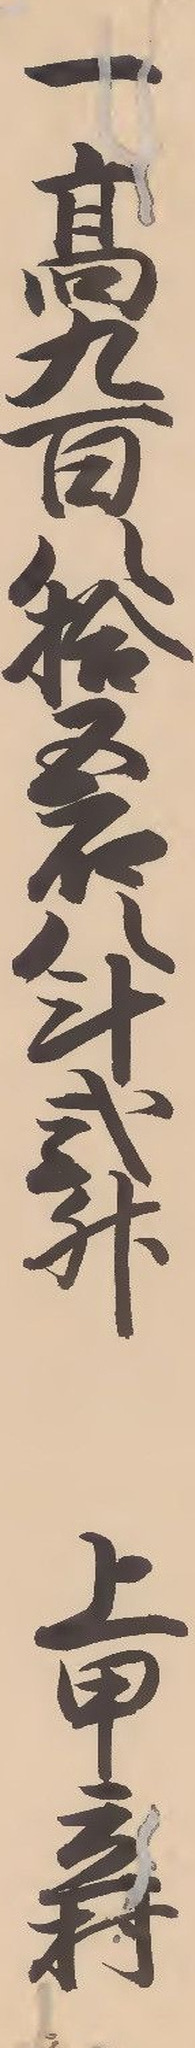一高九百八拾五石八斗弐升上甲立村
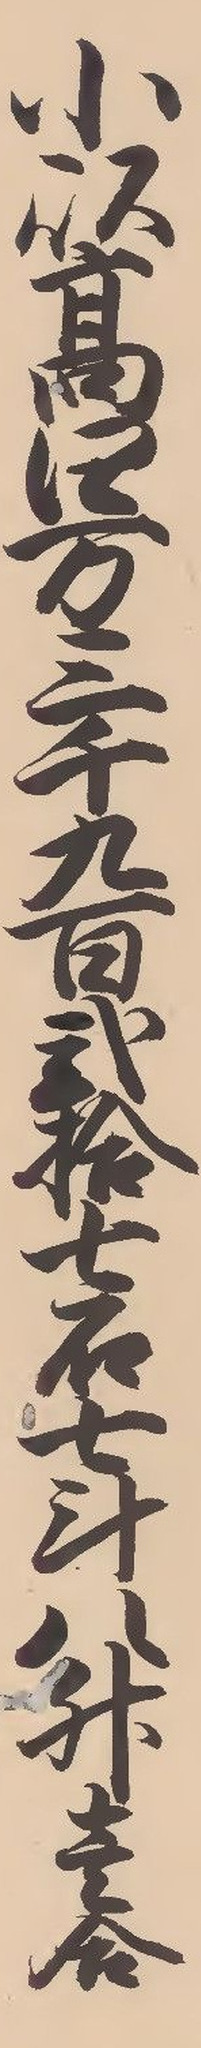小以高四万三千九百弐拾七石七斗八升壱合
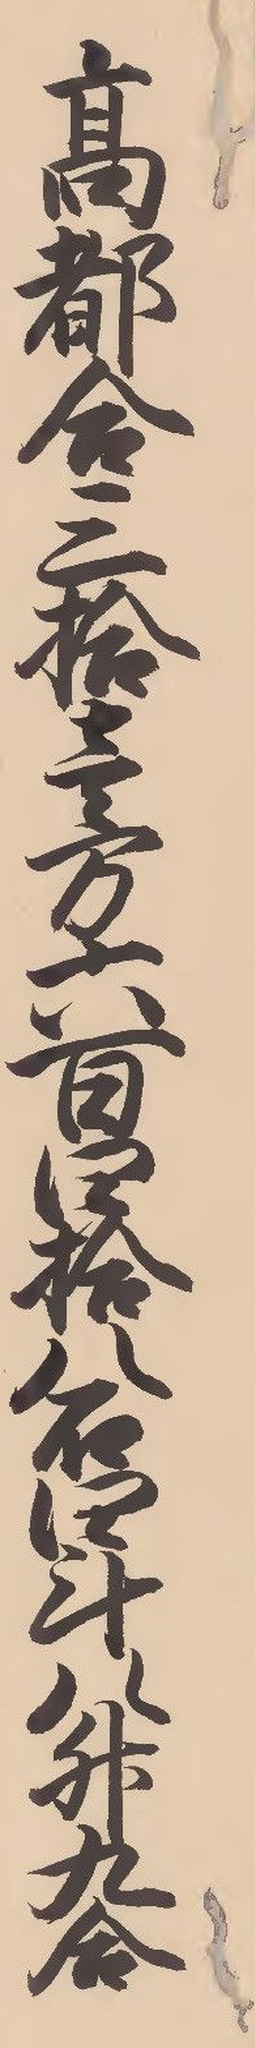高都合三拾壱万六百四拾八石四斗八升九合
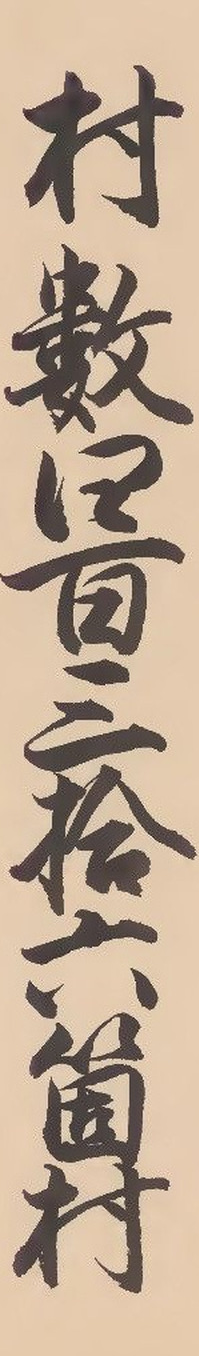村数四百三拾六箇村

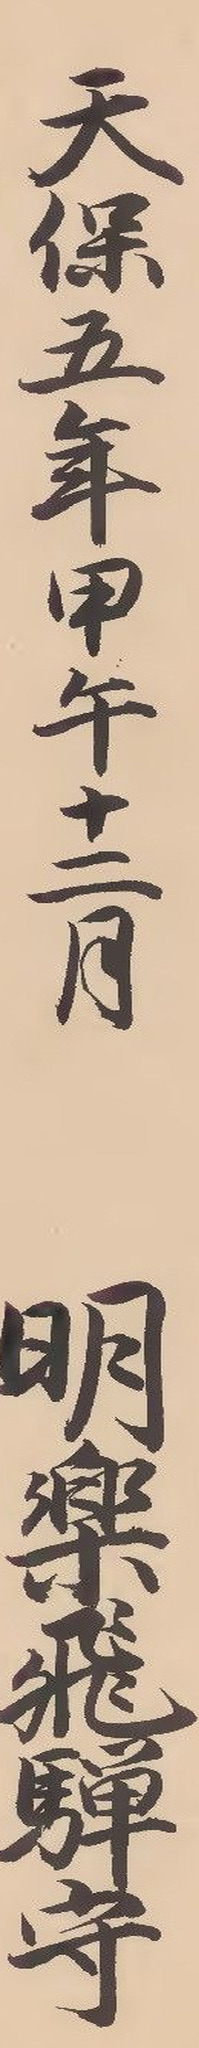天保五年甲午十二月明楽飛騨守
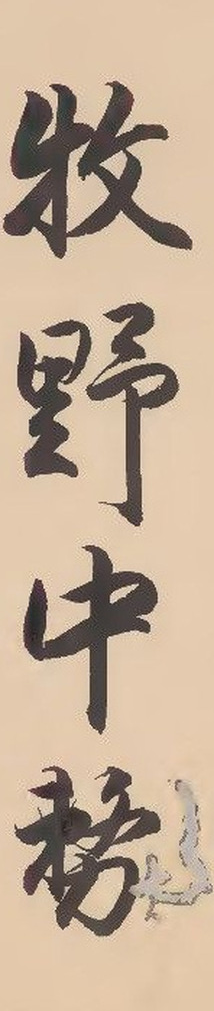牧野中務
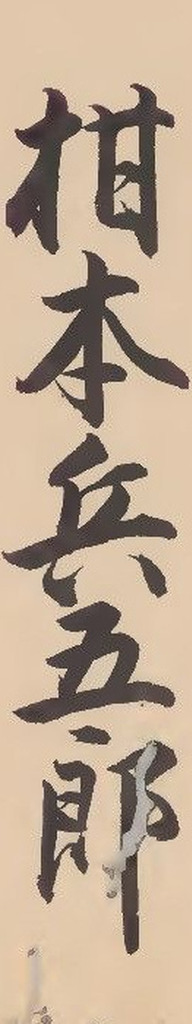柑本兵五郎
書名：安芸国郷帳
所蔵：国立公文書館 National Archives of Japan
